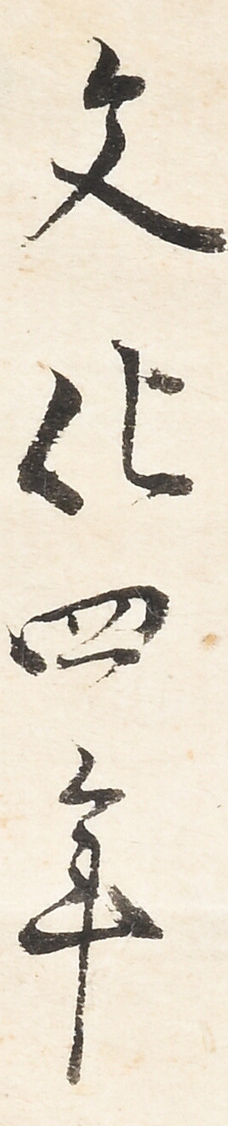文化四年
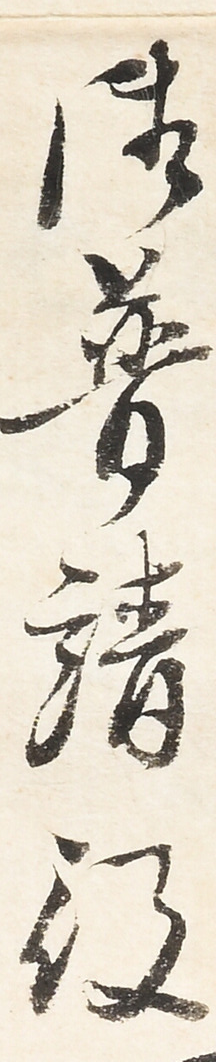御普請役
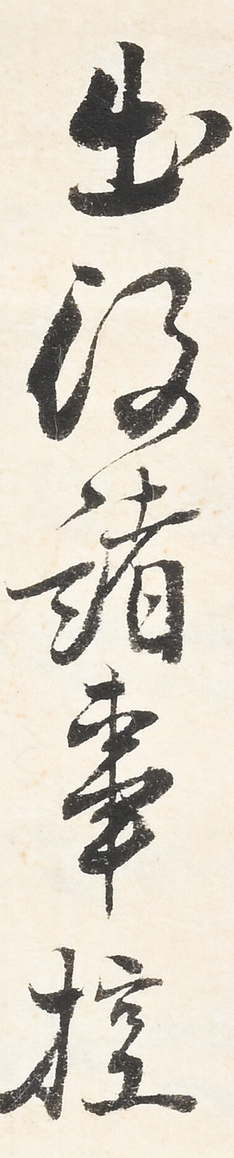出役諸事控
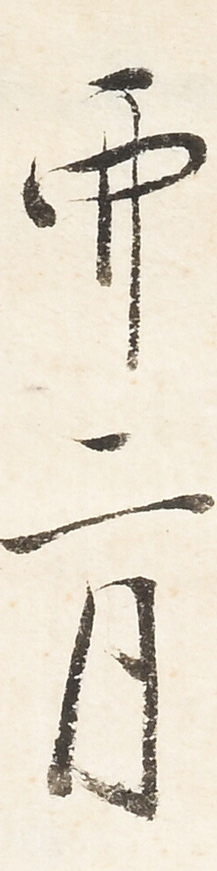卯二月
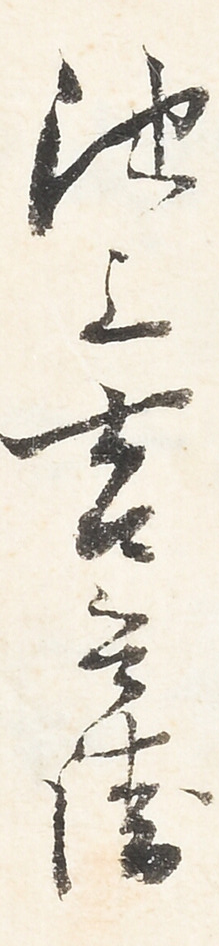池上吉兵衛
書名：江戸御勘定方御普請役御役人様御泊ニ付出役諸事控
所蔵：伊那市立高遠町図書館・合同会社AMANE
